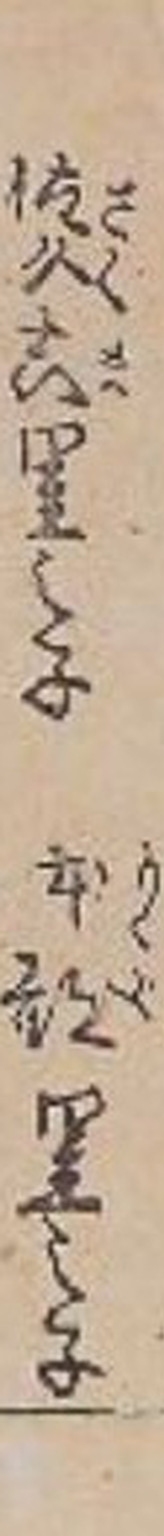佐久間里之子本部里之子
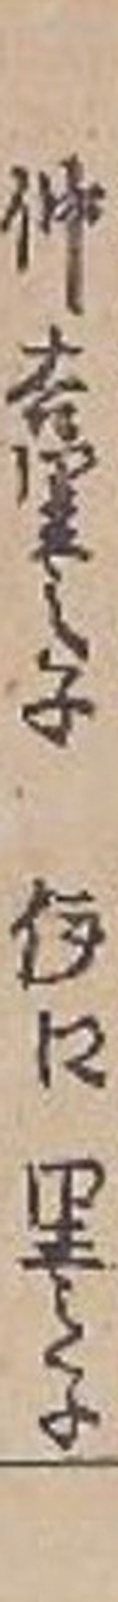仲吉里之子伊口里之子
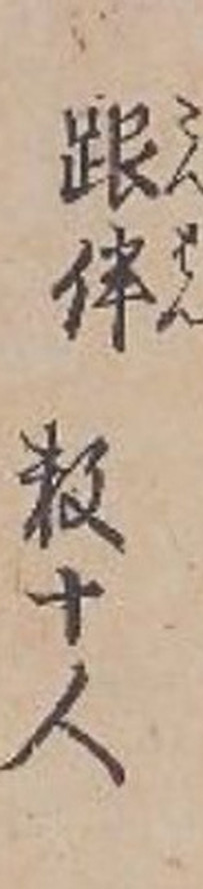跟伴数十人

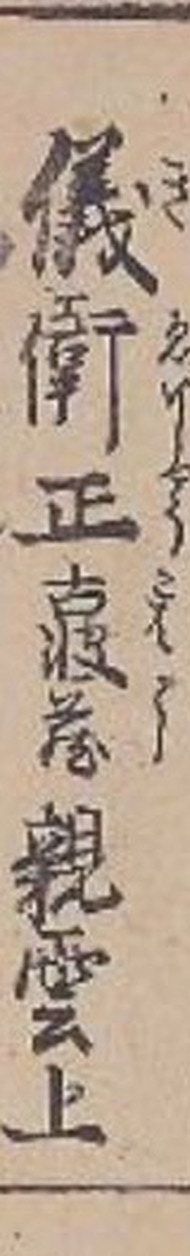議衛正古波蔵親雲上
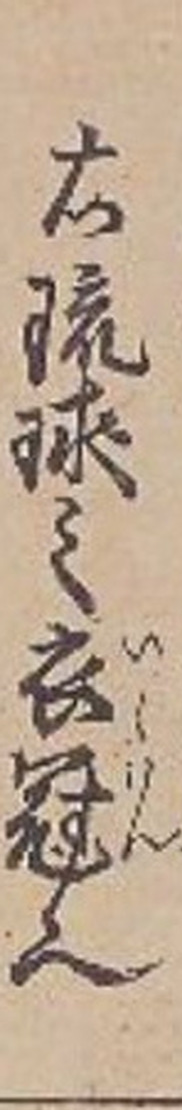右琉球の衣冠也
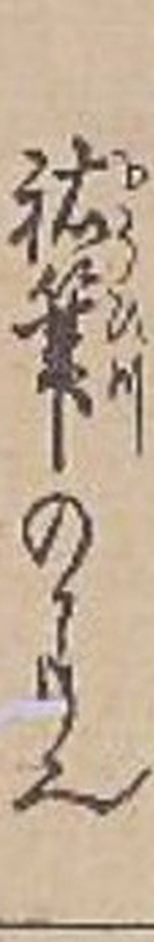祐筆の事也
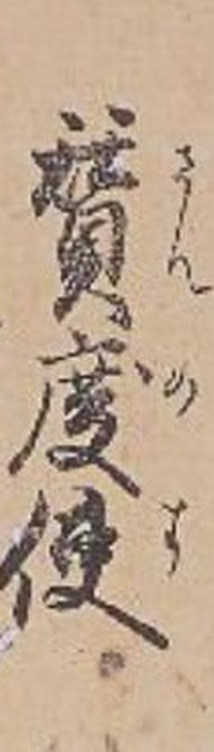賛度使
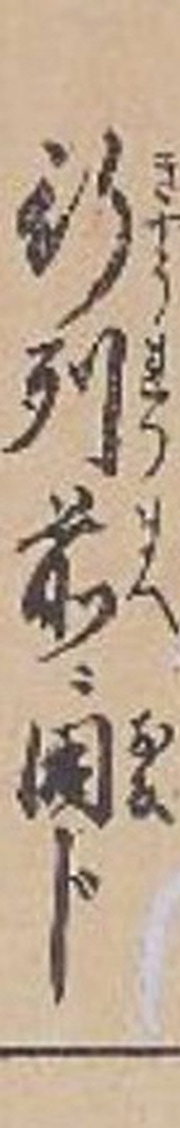行列前に同じ
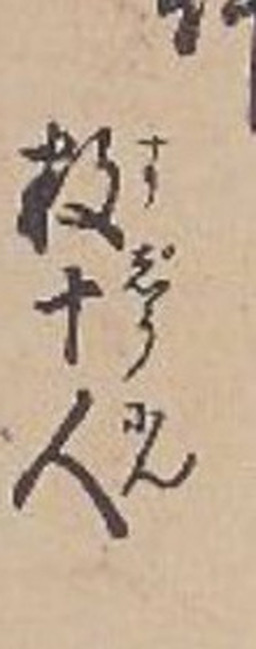数十人
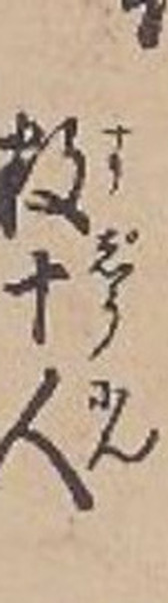数十人

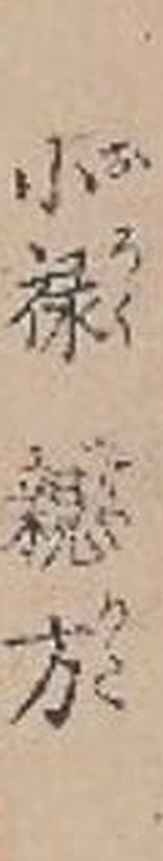小禄親方
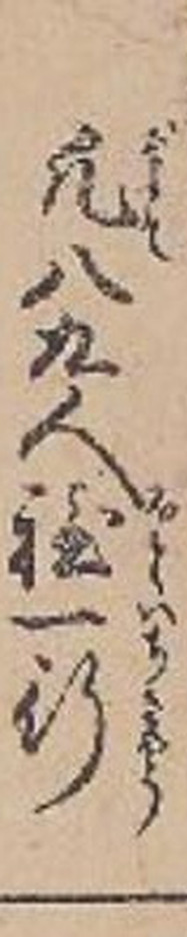凡八九人程一行
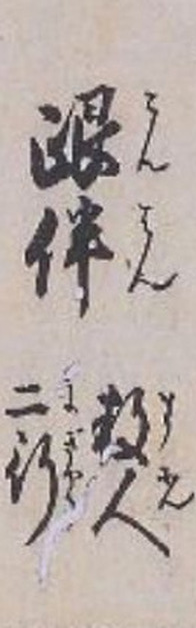跟伴数人
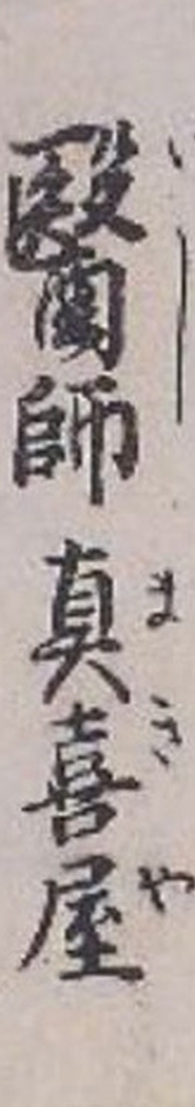醫師真喜屋
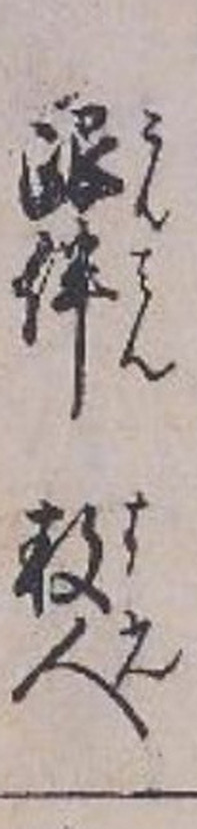跟伴数人

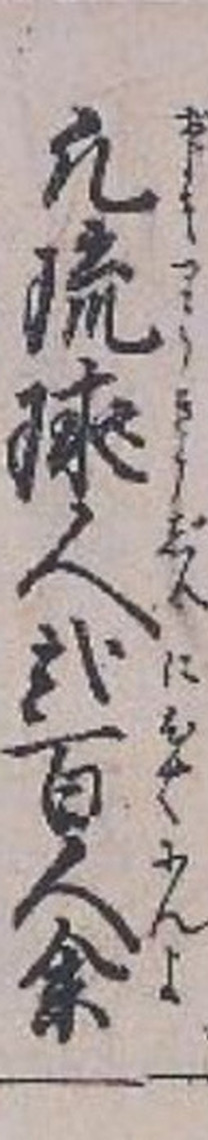凡琉球人弐百人余
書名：琉球人大行列記 来朝新板絵入
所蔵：University of the Ryukyus Library
